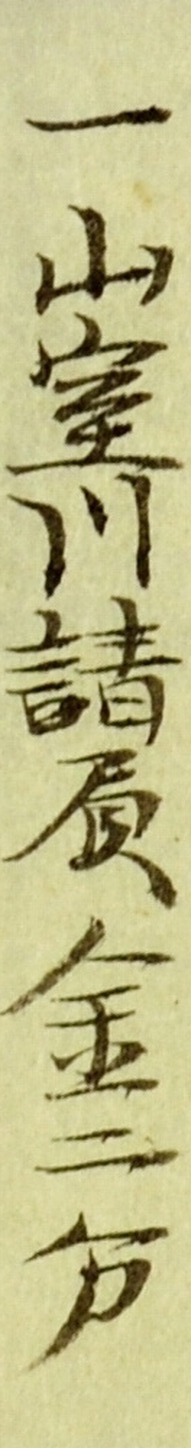一山室川請負金二分
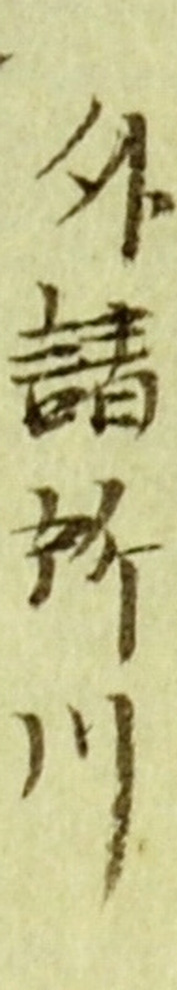外請所川
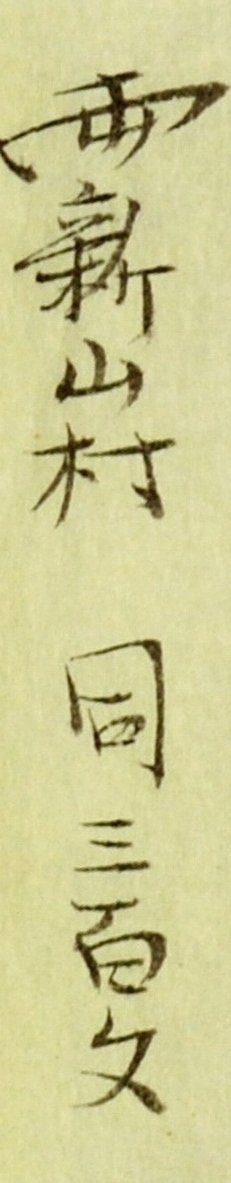両新山村同三百文

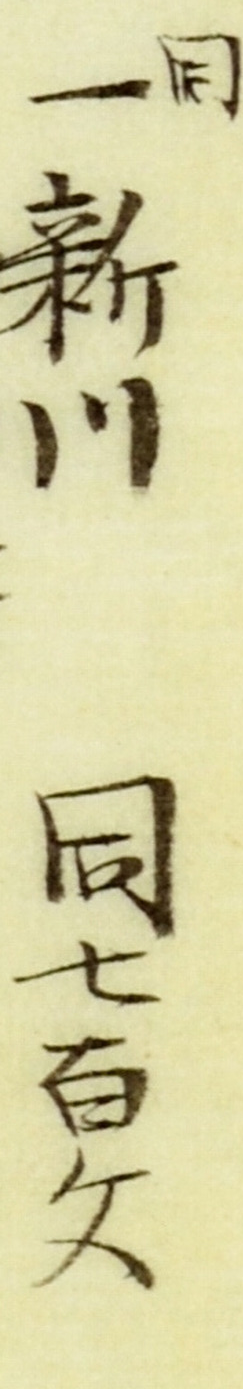一新川同七百文
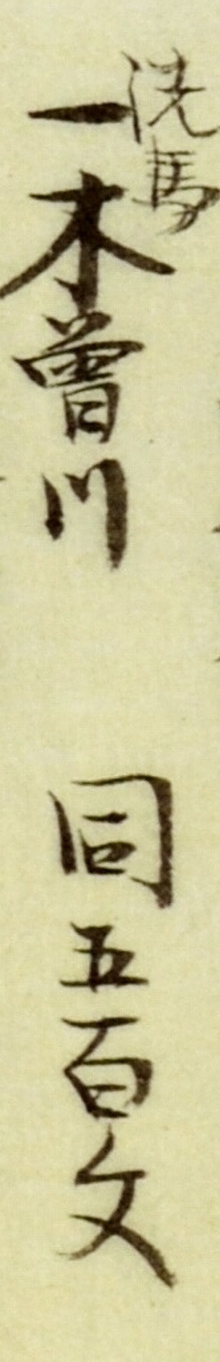一木曽川同五百文
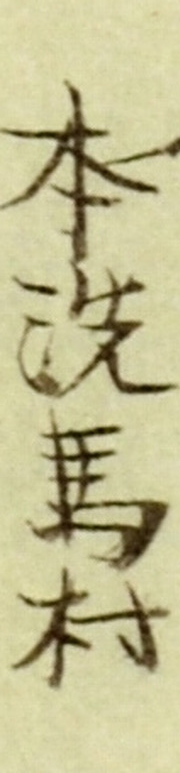本洗馬村
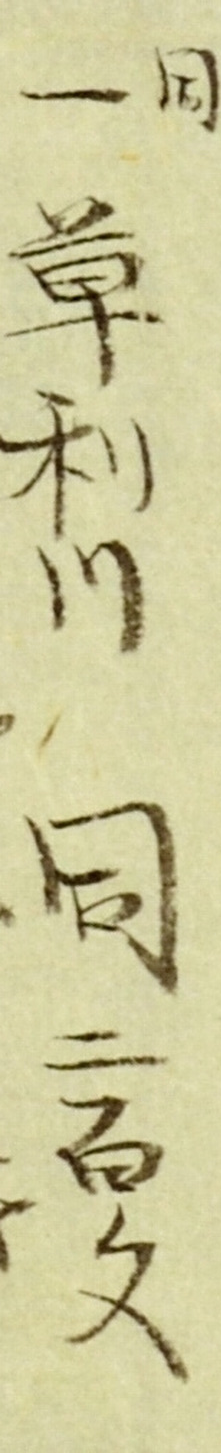一草利川同二百文
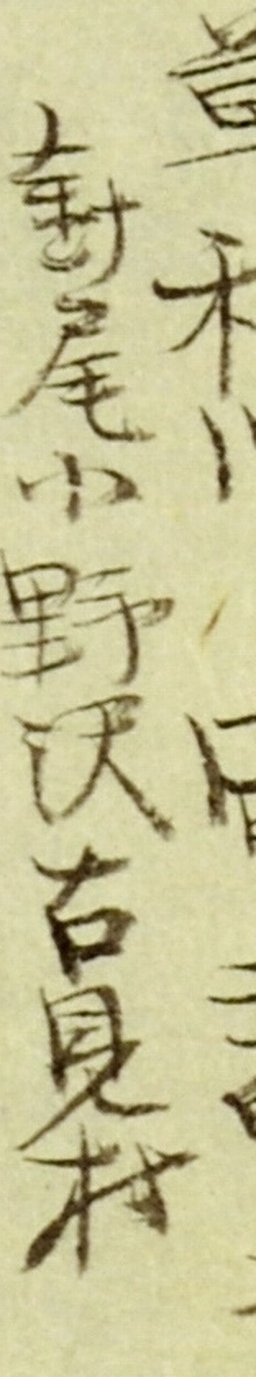針尾小野沢古見村
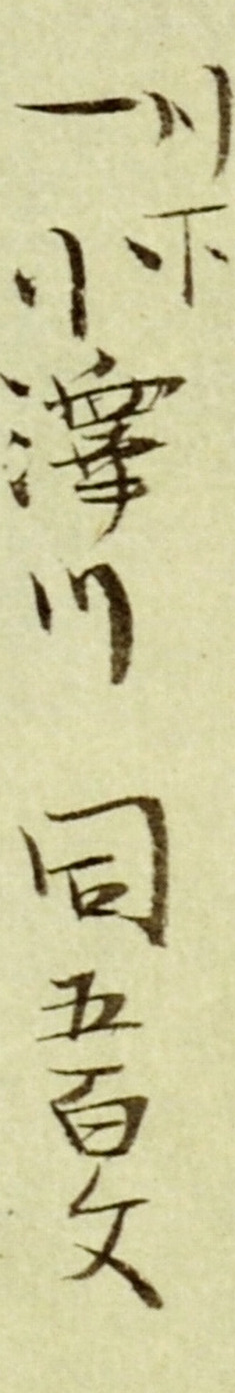一小澤川同五百文
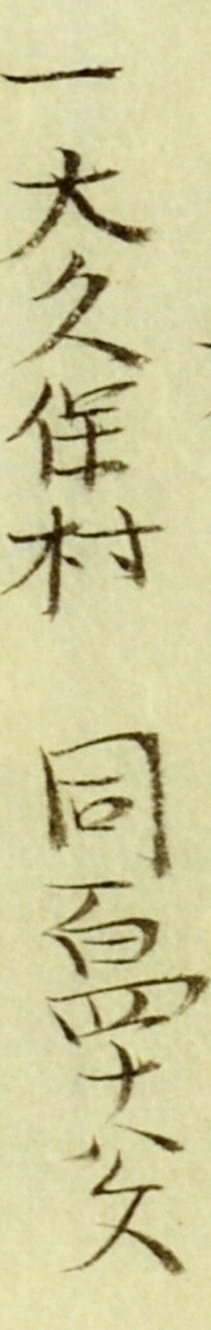一大久保村同百四十八文
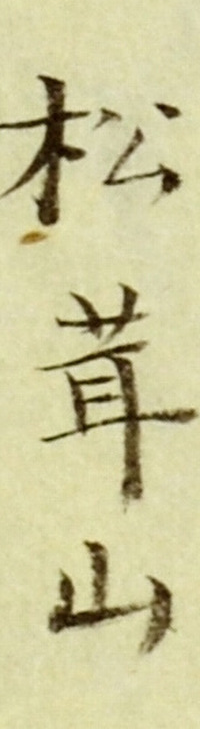松茸山
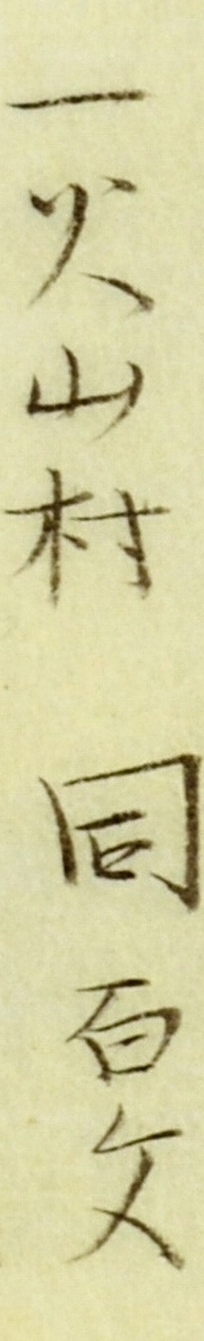一火山村同百文
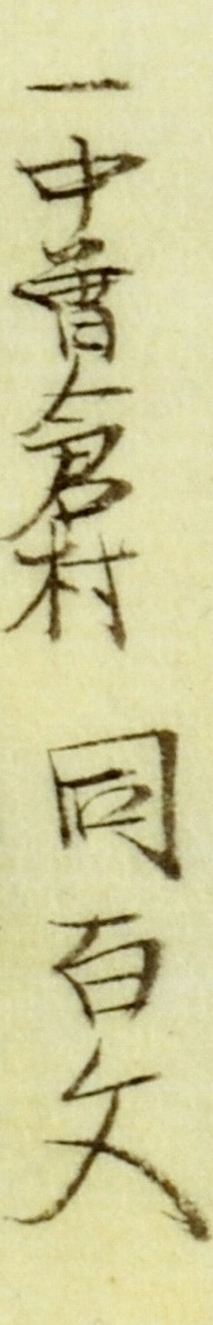一中曽倉村同百文
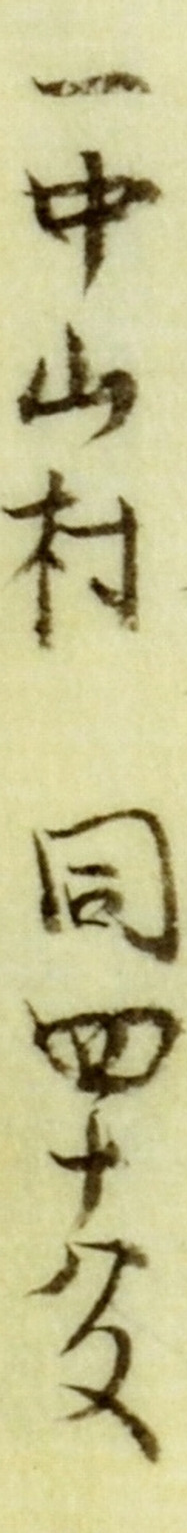一中山村同四十八文
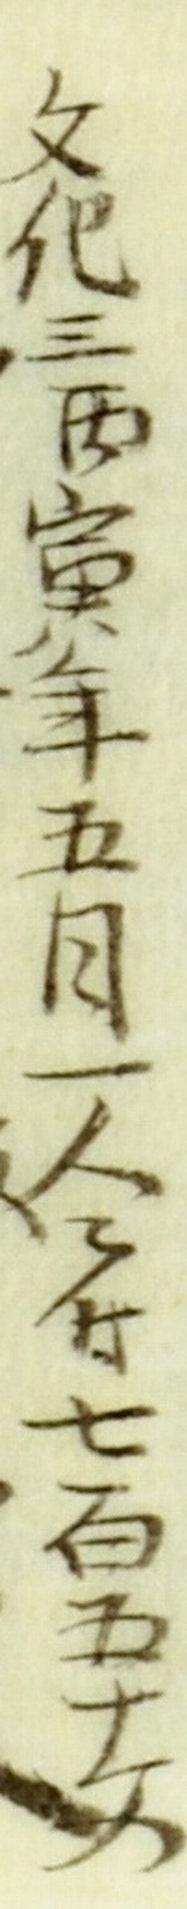文化三丙寅年五月一人ニ付七百五十文
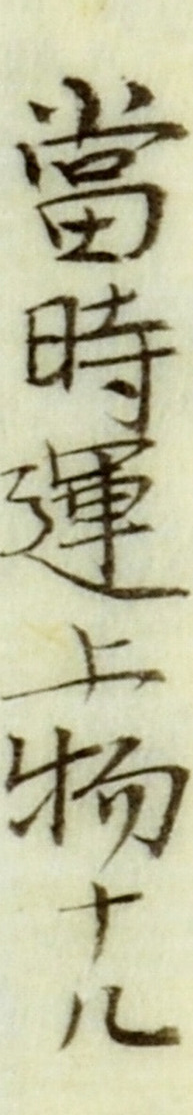当時運上物ナル
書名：分一御定法
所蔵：伊那市立高遠町図書館・合同会社AMANE
